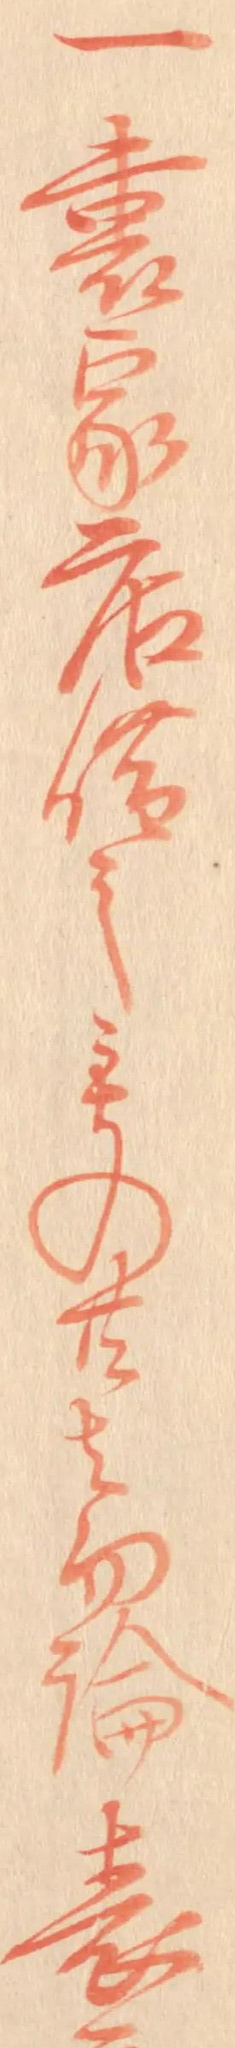一裏家店借之もの共は勿論表店
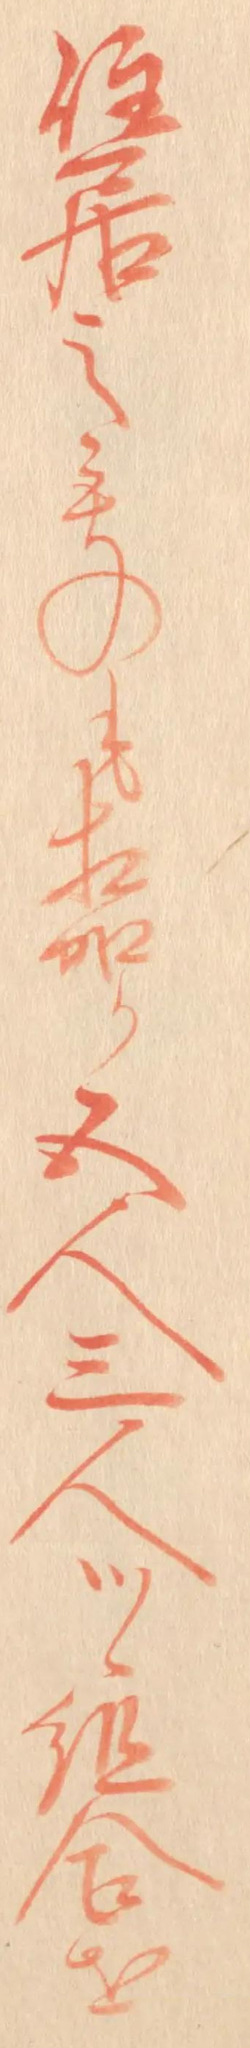住居之ものも相加り五人三人ツヽ組合を
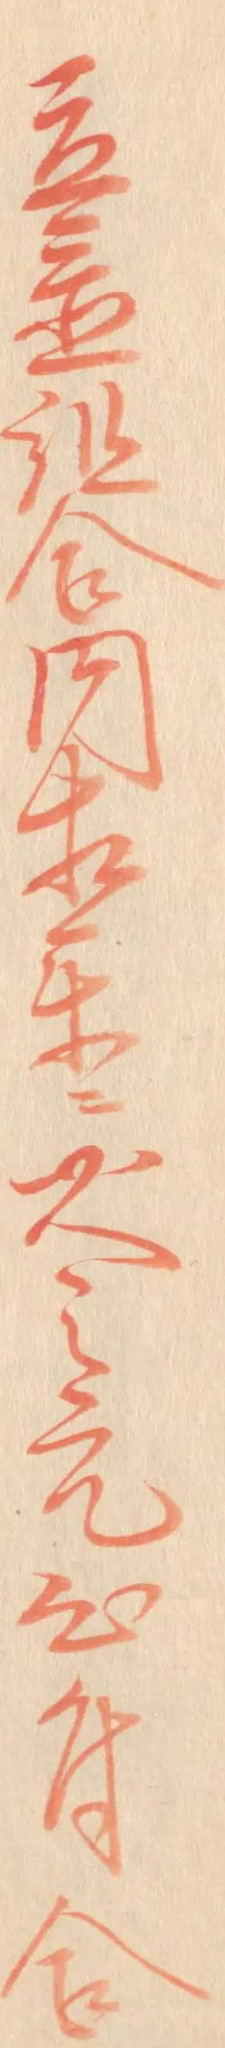立置組合内相互ニ火之元心付合
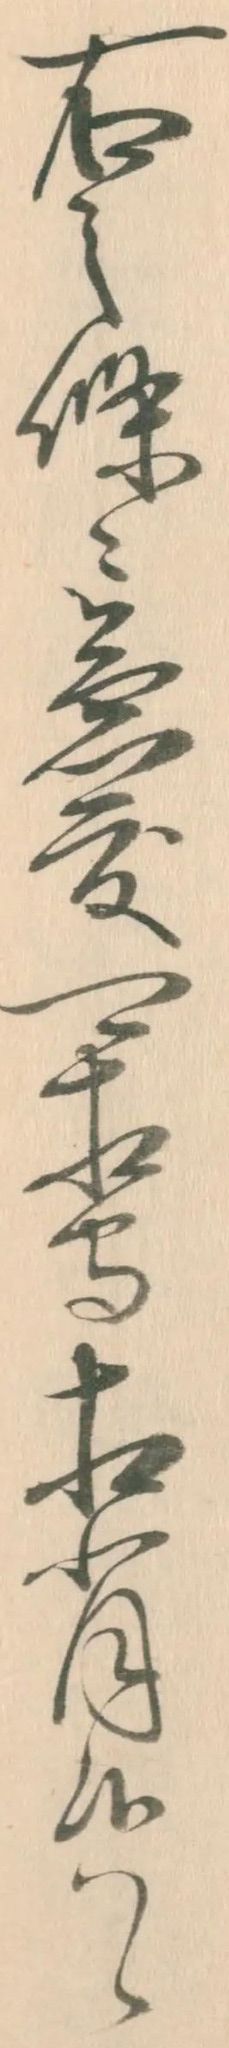右之条々急度可相守相背候ハヽ
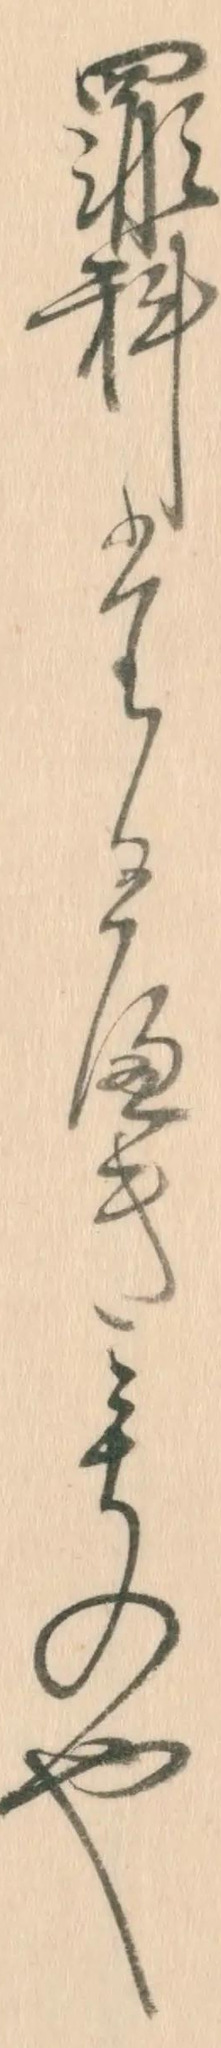罪科たるへきもの也
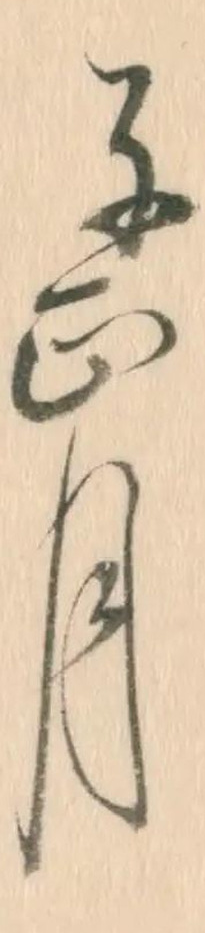子正月

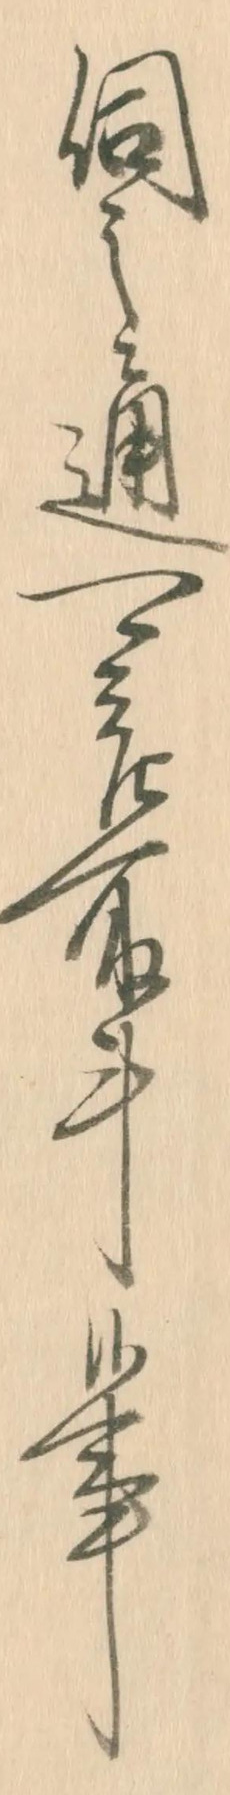伺之通可被取計候事

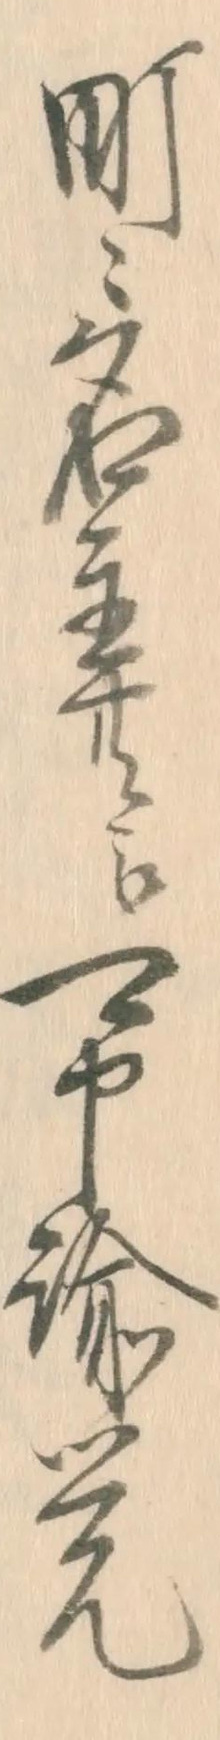町々名主共え可申諭覚
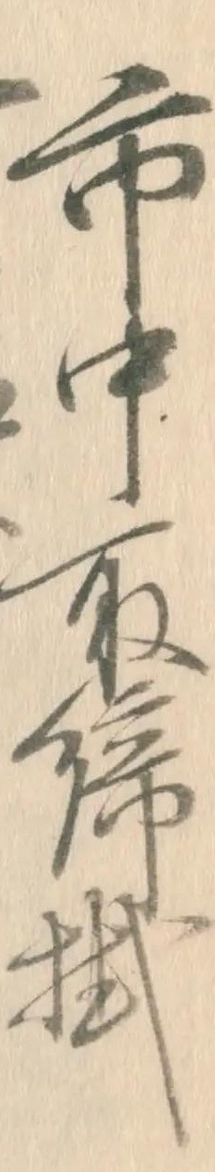市中取締掛
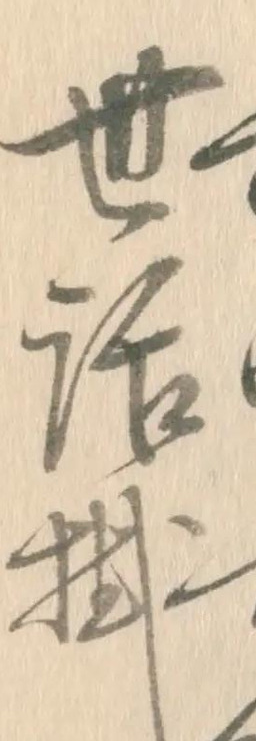世話掛
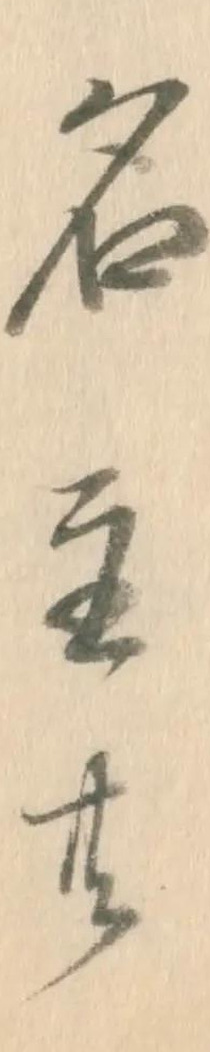名主共

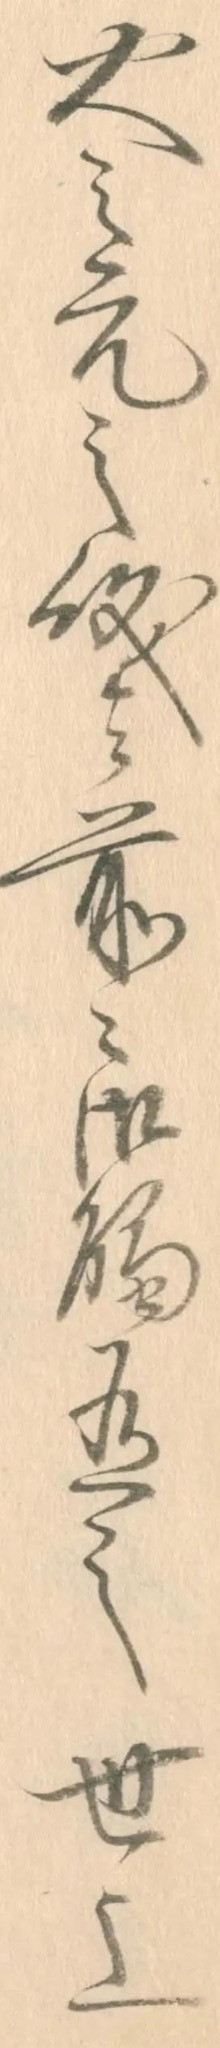火之元之儀は前々御触有之世上
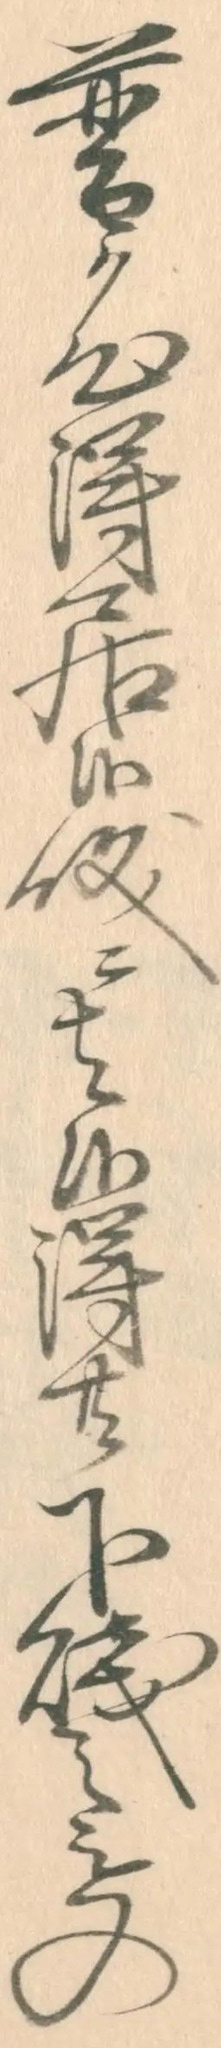普ク心得居候儀ニは候得共下賎之もの
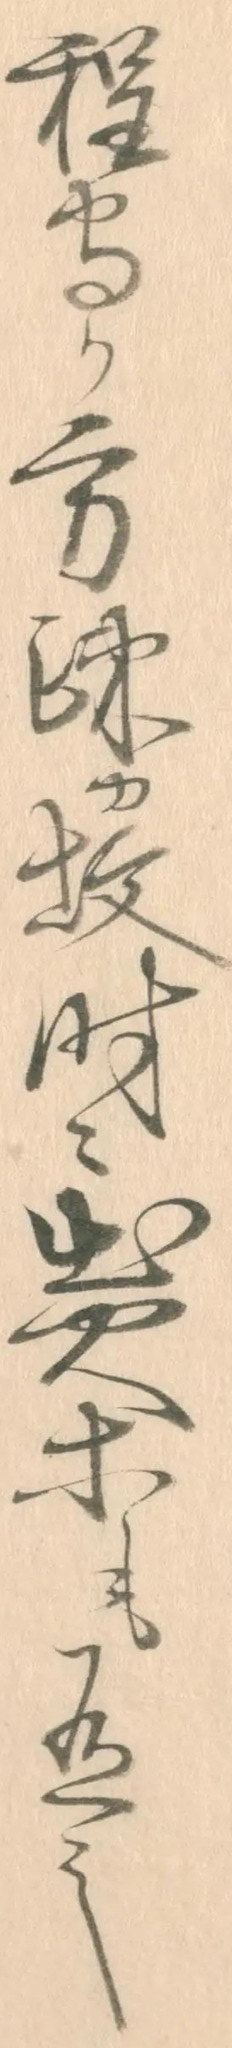程守り方疎カ故時々出火等も有之
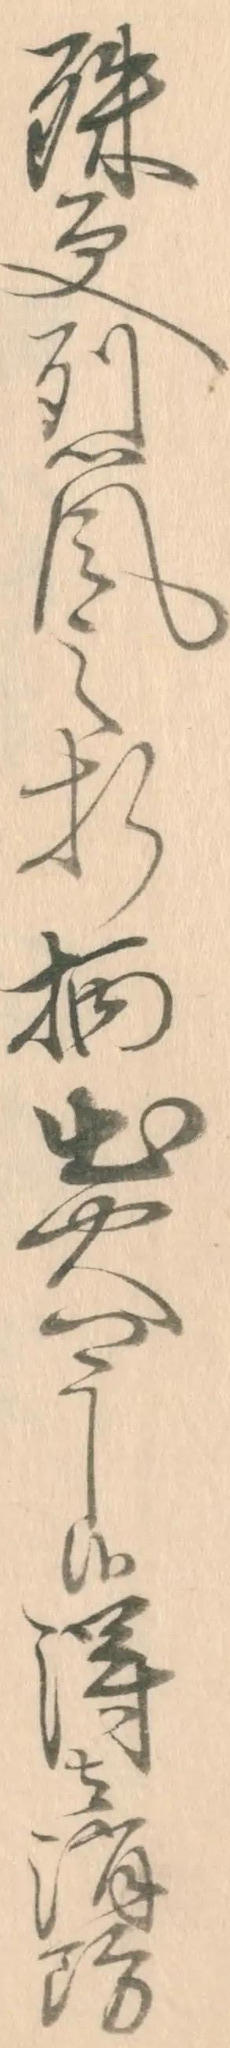殊更烈風之折柄出火いたし候得は消防
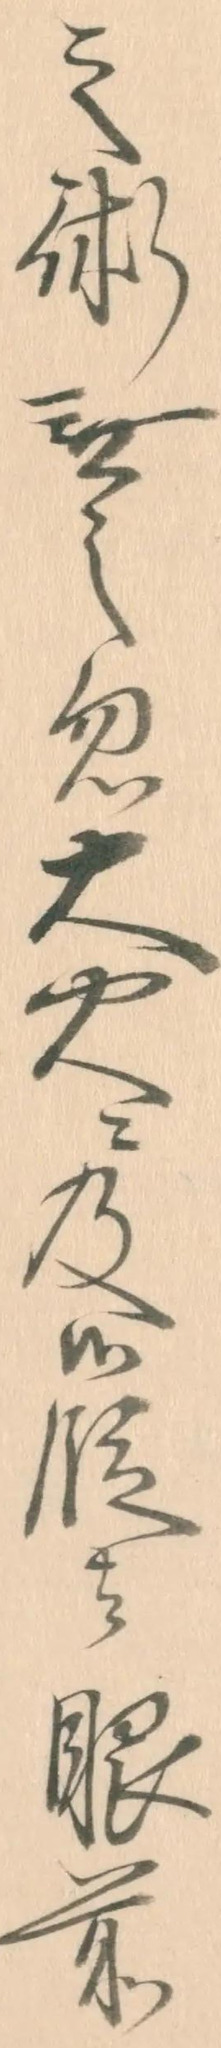之術無之忽大火ニ及候段は眼前
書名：三橋 17巻. [7] 三橋小破御修復書留　但御奉行御掛リ替地震潰橋番屋　嘉永四亥年より安政二卯年迄　上
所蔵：国立国会図書館 National Diet Library, JAPAN
